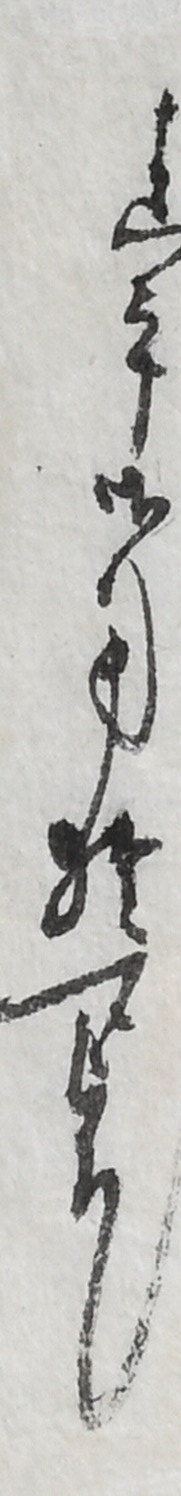連年御用捨可被下候
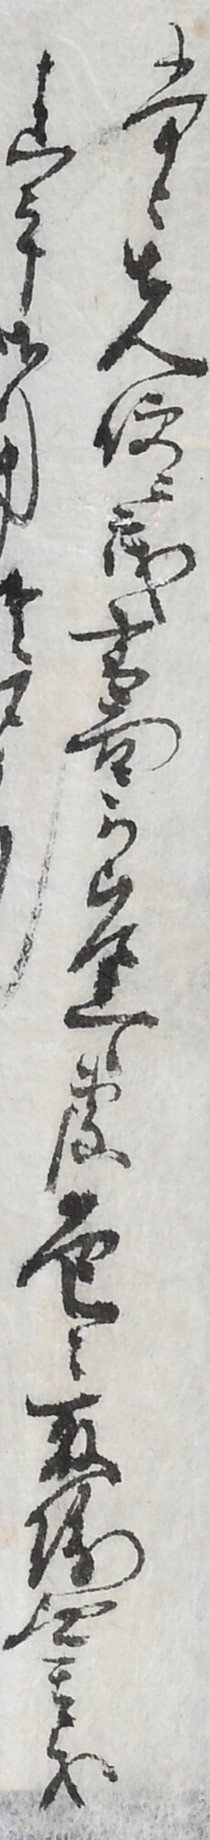尚々先便ニ茂書面可差上候処色々取紛無其茂
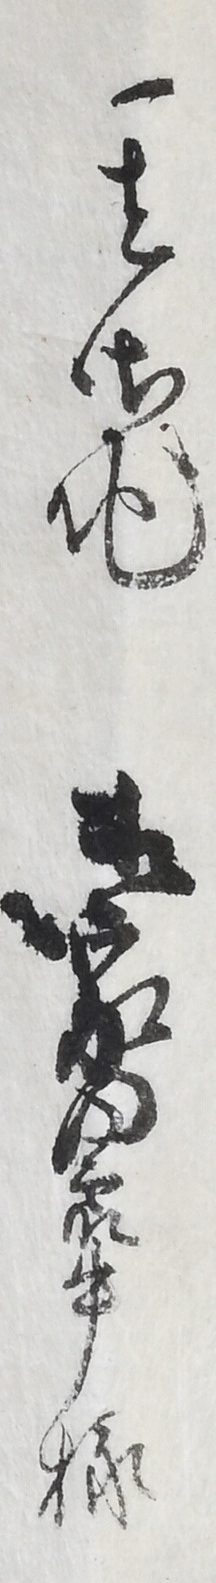一は御地御家内衆中様
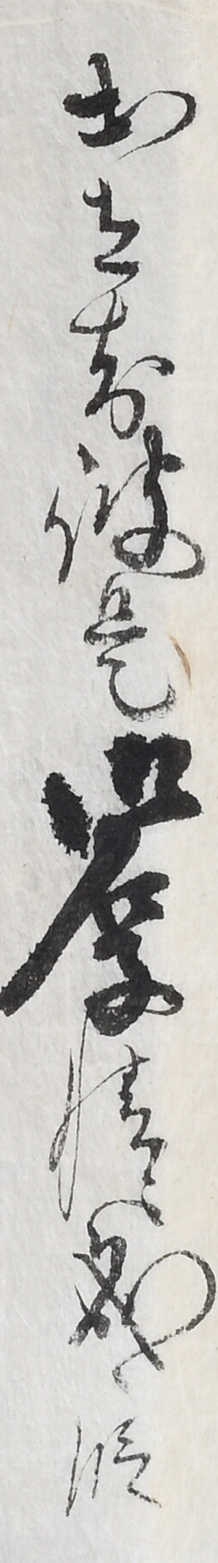出立寄彼是御厚情被成候段
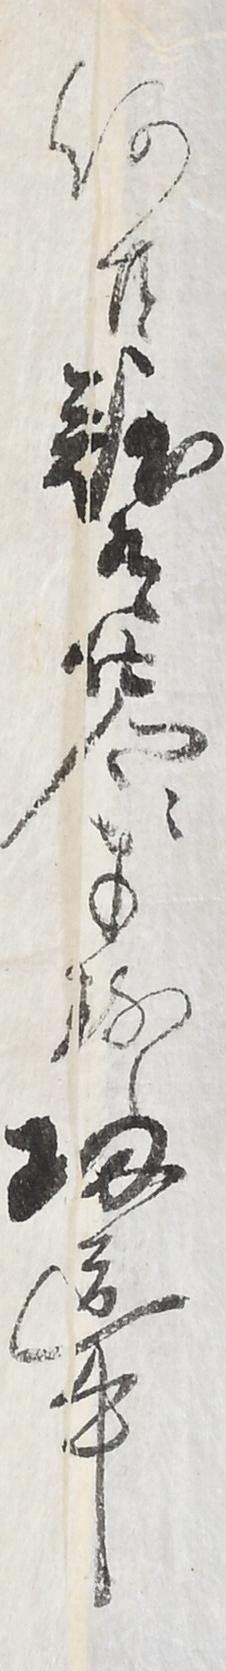何共難有仕合ニ存奉候扨道中
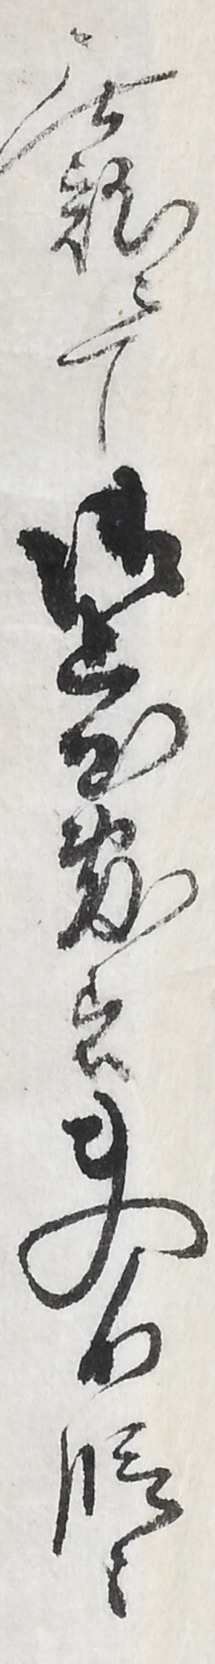無難ニて御上出敷節夫ゟ段々
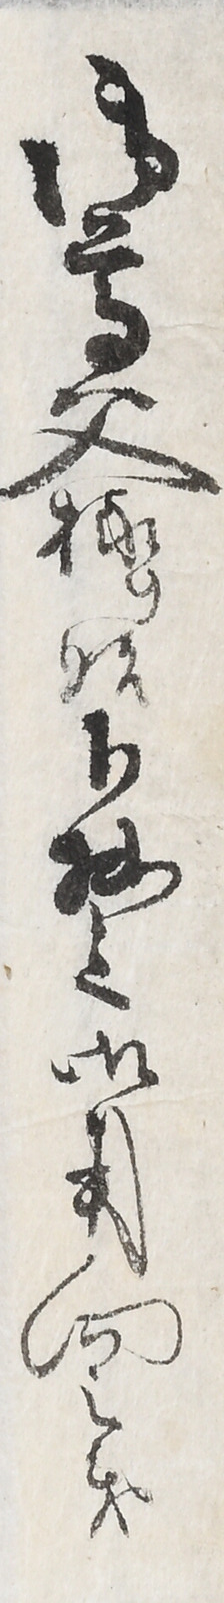御尊父様ニ始下残迄御用向之茂
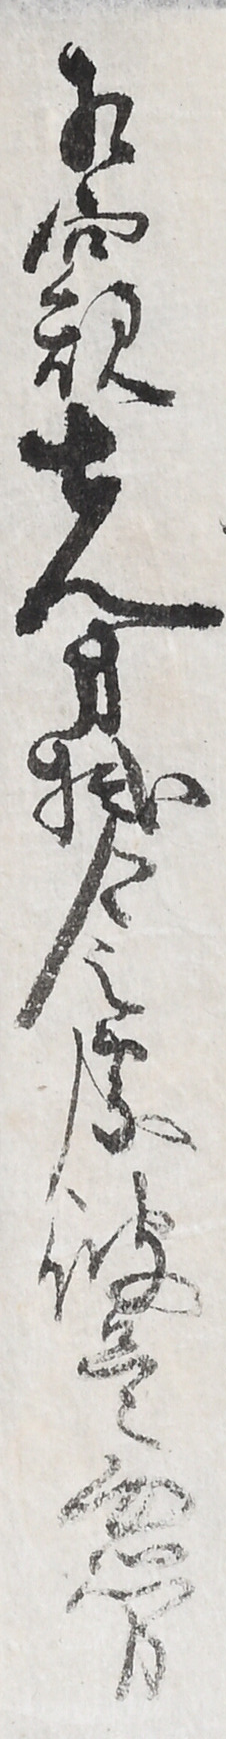相窺先日日掛合之処彼是惣方
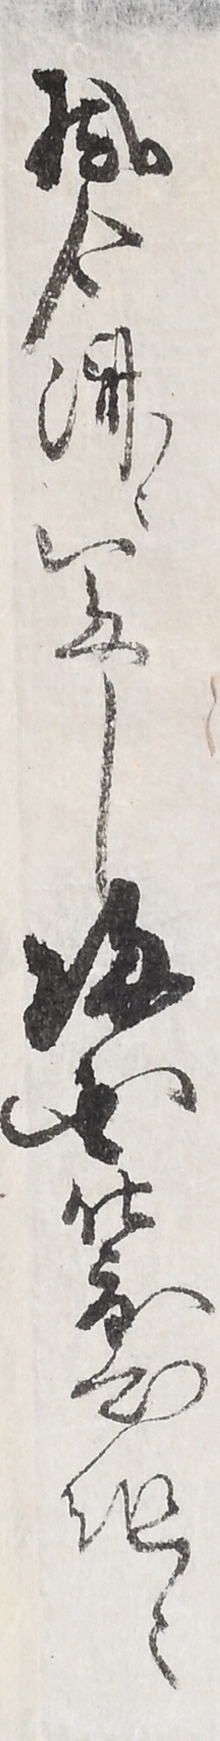掛合済候いたし帰国仕度知組之
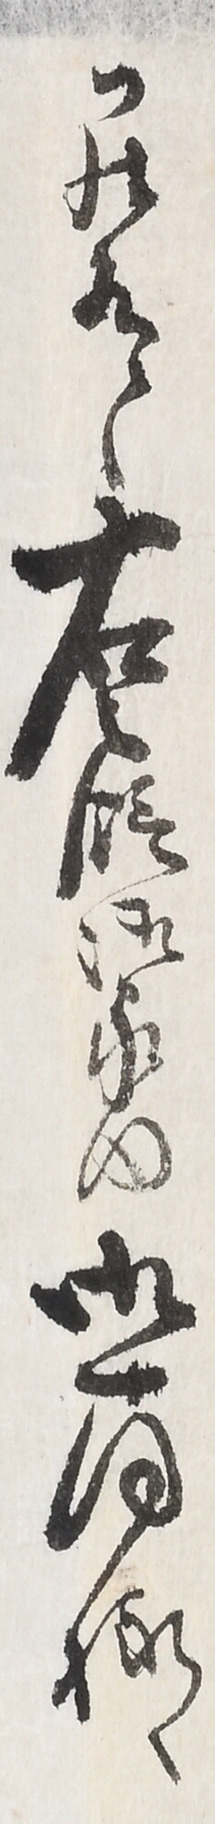罷出之右之段御家内御一同様江
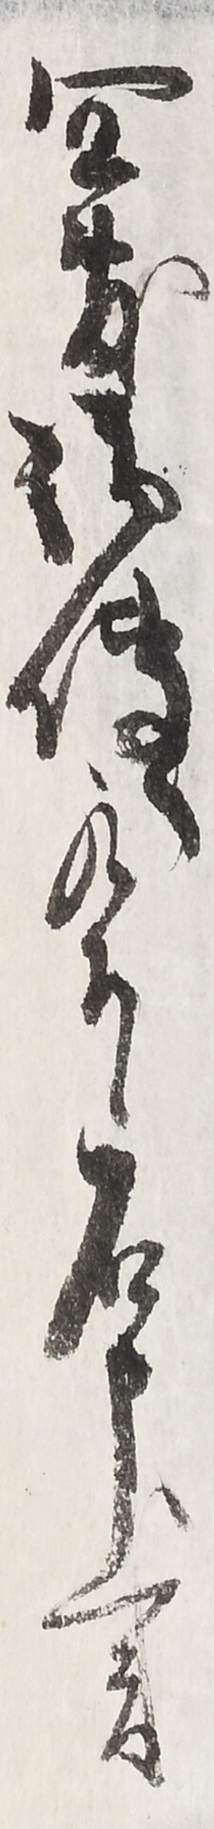宜敷請伝被下候右申上亦
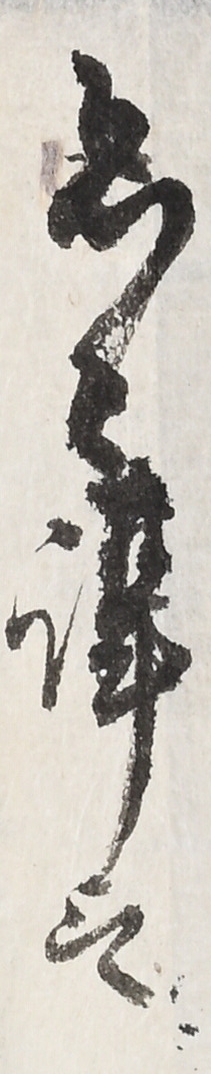恐々謹言
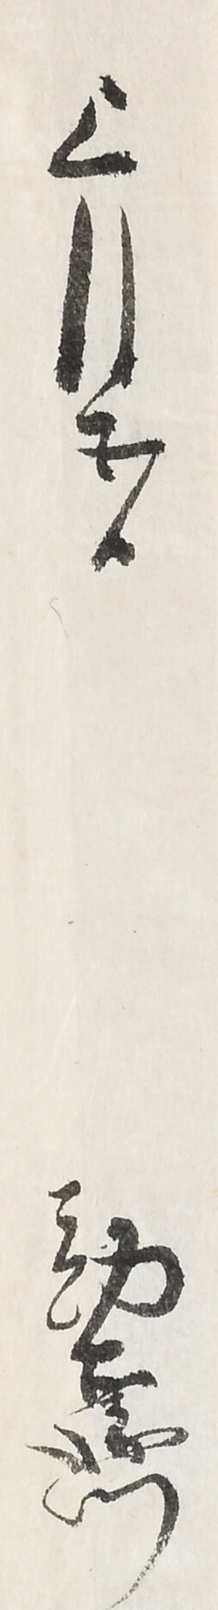三月五日勘右衛門
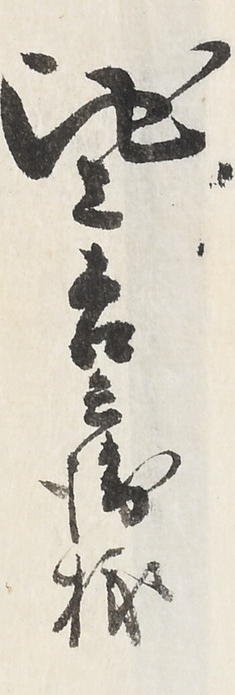池上吉兵衛様
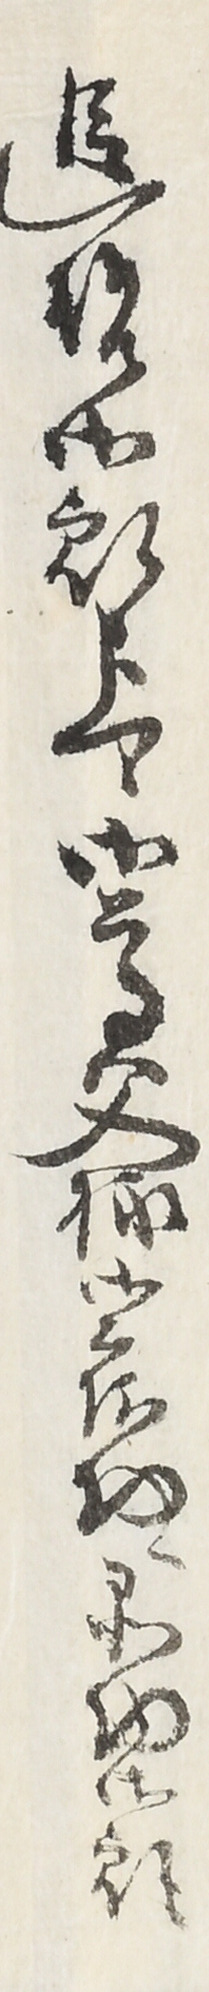追啓御願申上候御尊父様御荷物江品物御願
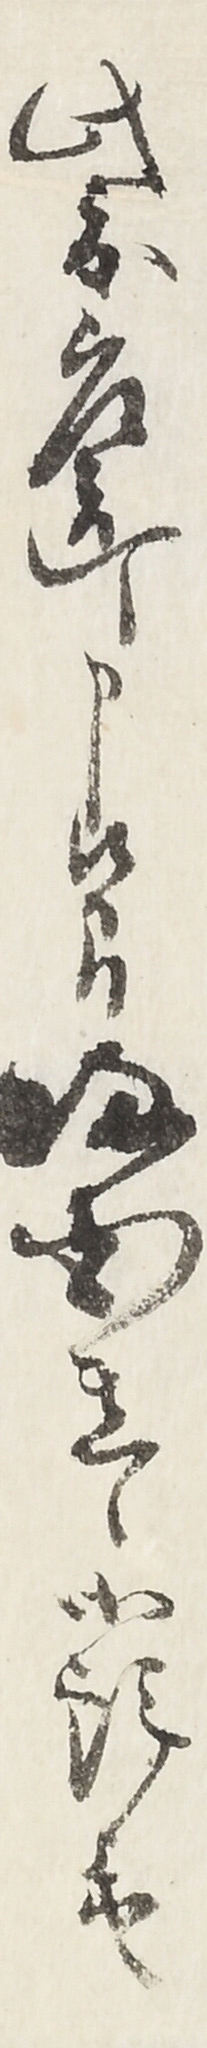此度仕差送り申候間帰国遣候御頭無
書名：口演
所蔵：伊那市立高遠町図書館・合同会社AMANE
